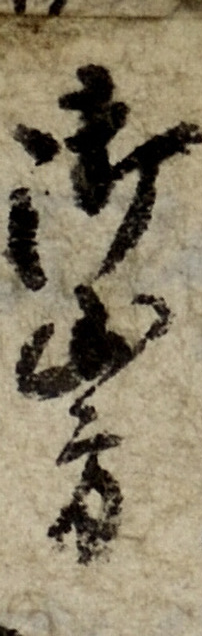御山方
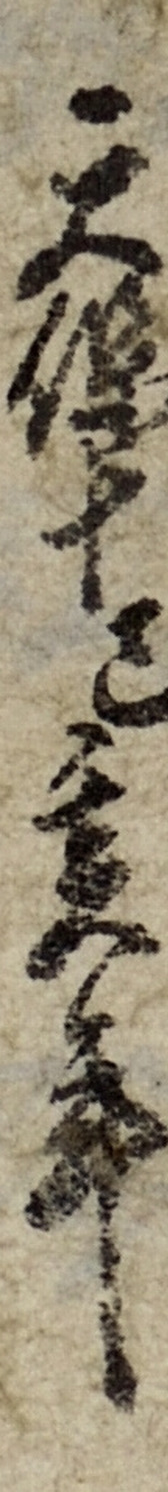天保十己亥年
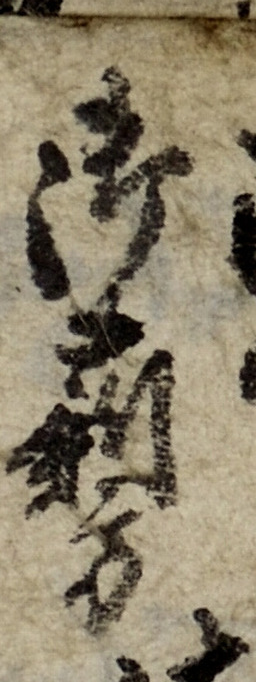御山方
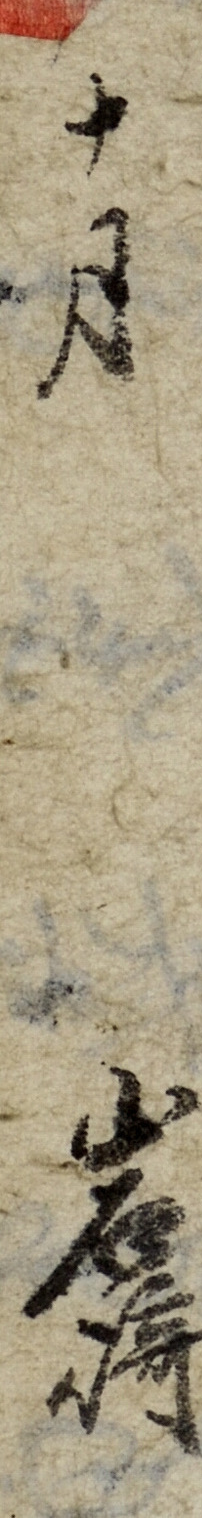十月岩崎
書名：御山方御薪方諸扱部分控
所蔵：伊那市立高遠町図書館・合同会社AMANE
